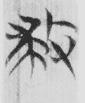救
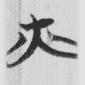火
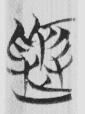𪴿
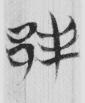邦
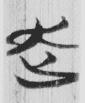走
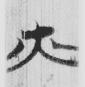火
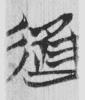進
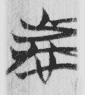者
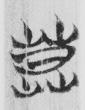莫
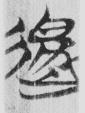退
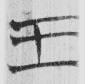王
